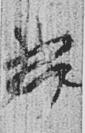弗
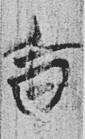昏（聞）
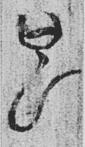也
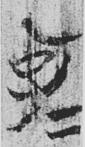孔子
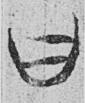曰
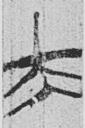夫
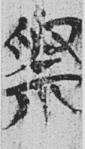祭
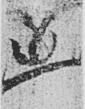至
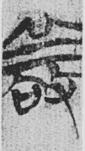敬
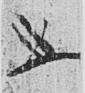之
